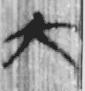大
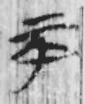帀（師）
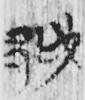○（越）
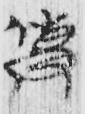儥
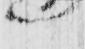㠯（以）
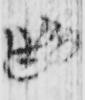○（廷）
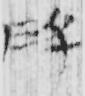阩
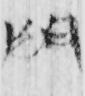門
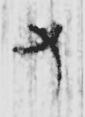又
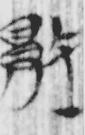敗
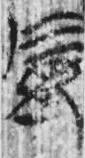碨
